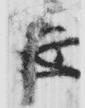正
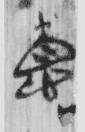惪
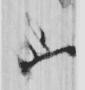之
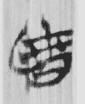{母日}
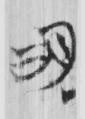明
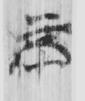不
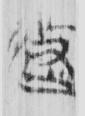﨤
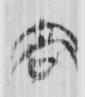高
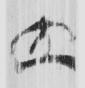立
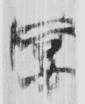厚
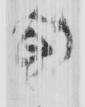飤
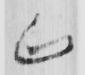㠯（以）
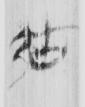居
